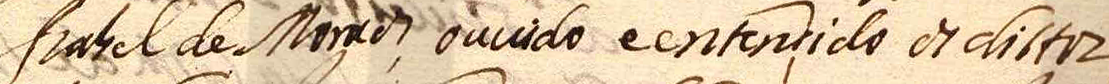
Jzabel de Moraes, ouuido e entendido os dittos
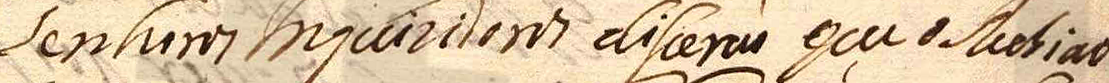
Senhores Inquizidores disseraõ que o Rcebiaõ
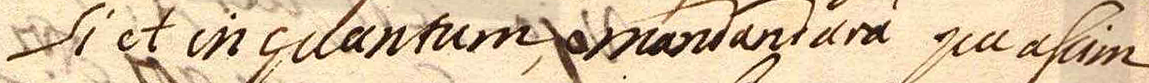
si et in quantum, o mandandará que assim
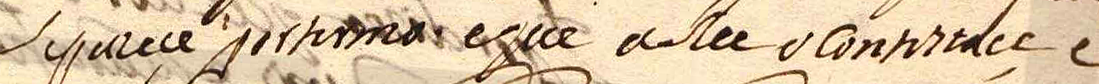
se puzece por termo e que a Ree o contestace, e
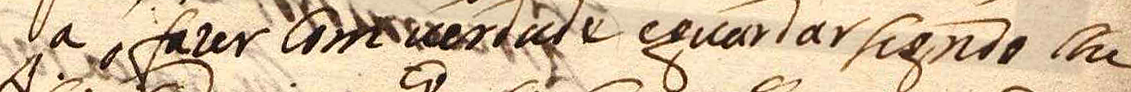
p.a o fazer com uerdade e guardar segredo lhe
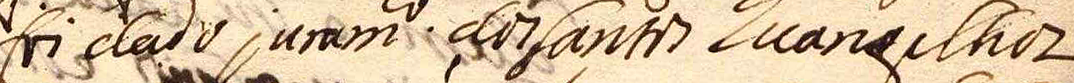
foi dado juram.to dos santos Euangelhos
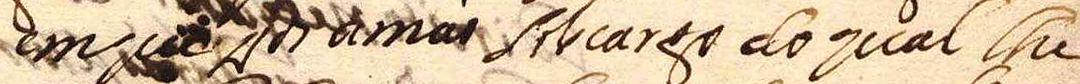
em que pos a máo sob cargo do qual lhe
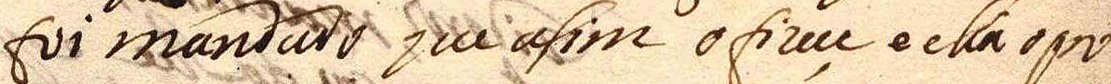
foi mandado que assim o fizece e ella o pro
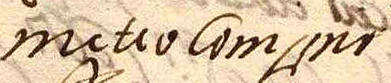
meteo comprir.
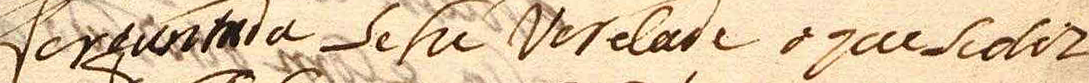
Perguntada se hé verdade o que se diz
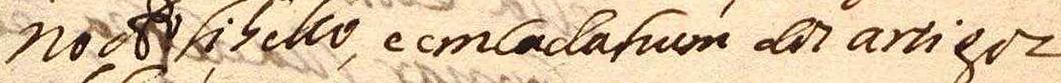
no d̄.o libello, e em cada hum dos artigos
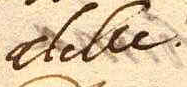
delle?
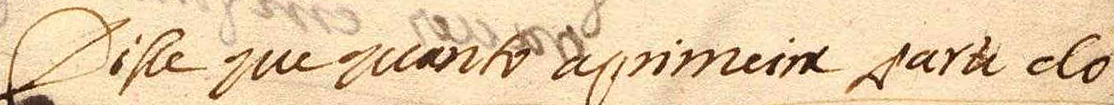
Disse que quanto a primeira parte do
